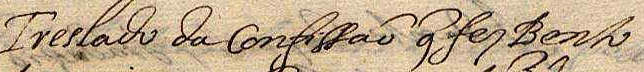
Treslado da confissaõ q̄ fez Bento
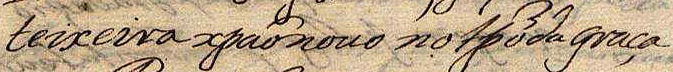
teixeira xpaõ nouo no tpō da graça
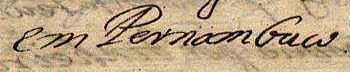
em Pernambuco
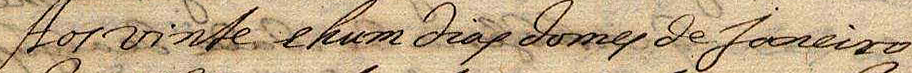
Aos vinte e hum dias do mes de Janeiro
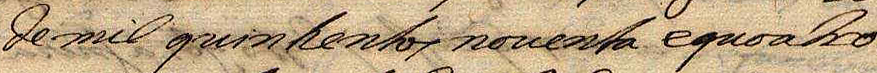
de mil quinhentos nouenta e quoatro
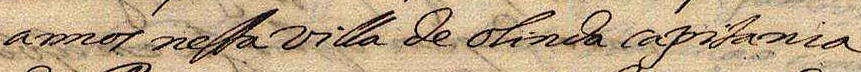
annos nesta villa de olinda capitania
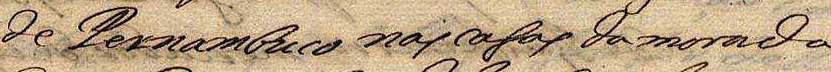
de Pernambuco nas casas da morada
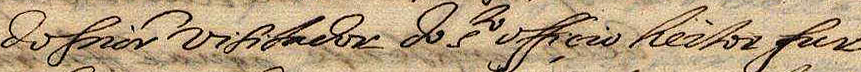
do snor̄ visitador do sto offiçio heitor fur
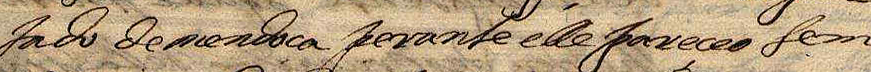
tado de mendoça perante elle pareçeo sem
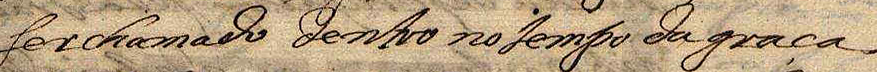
ser chamado dentro no tempo da graça
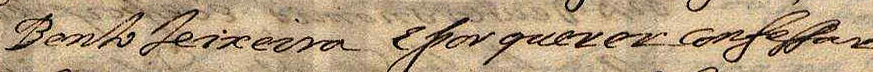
Bento teixeira E por querer confessar
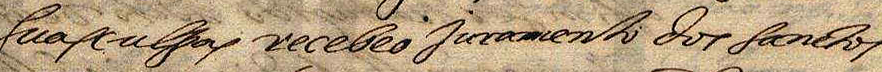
suas culpas reçebeo Juramento dos sanctos
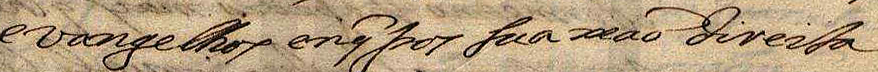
evangelhos en q̄ pos sua maõ direita
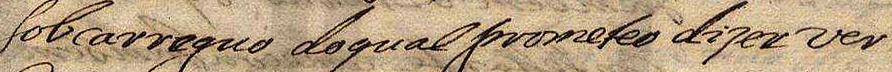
sob carreguo do qual prometeo dizer ver
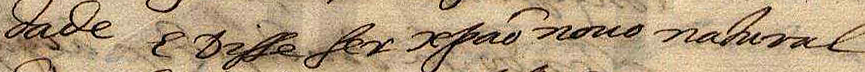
dade E Disse ser xpaõ nouo natural
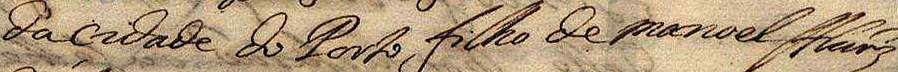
da çidade do Porto filho de maniel Alurz̄
